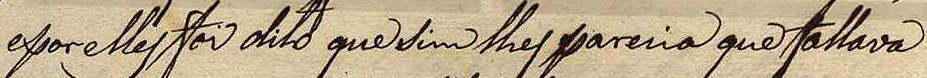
e por elles foi dito que sim lhes parecia que fallava
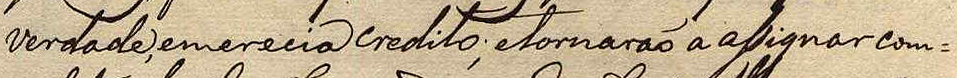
verdade, e merecia credito; e tornaraõ a assignar com
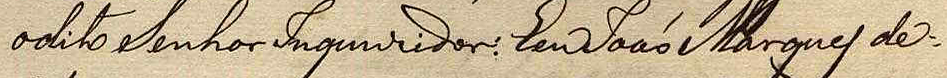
o dito Senhor Inquezidor: E eu Ioaõ Marques de
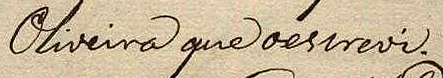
Oliveira que o escrevi.
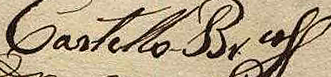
Castello Br.co
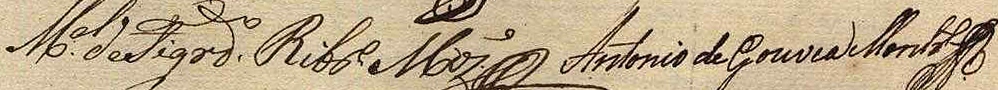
M.el de Figrd.o Ribr.o Miz̄ Antonio de Gouvea Montr.o
